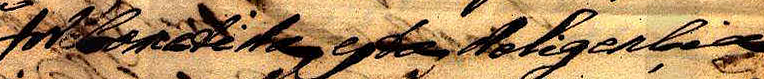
for Cometida esta deligenÇia
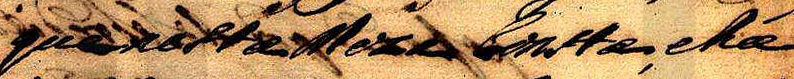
que nesta Meza Consta, e há
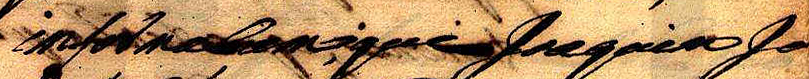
imformaÇam, que Joaquim Jo
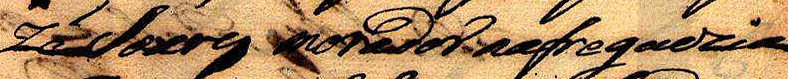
zé Soares morador na freguezia
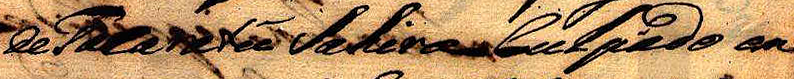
de TaCaratée Sahira CuLpado em
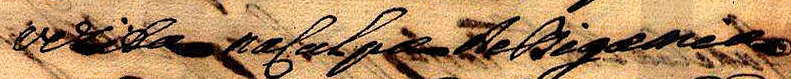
vizita na Culpa de Bigamia
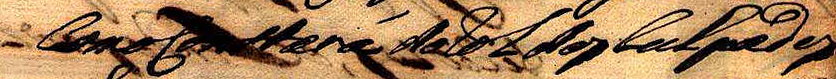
Como Co_stará do Rol dos CuLpados
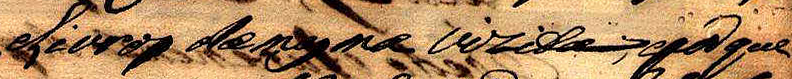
e Livros da mesma vizita, e por que
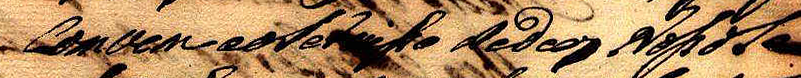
Comvem ao Servisso de Deos Nosso Se
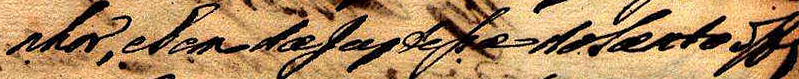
nhor, e bem da Justissa do Santo offi
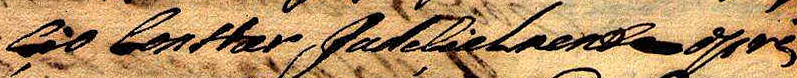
Çio Constar JudeÇiaLmente o pri
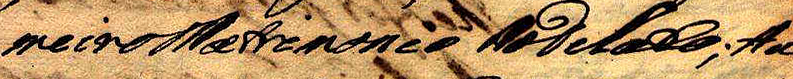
meiro Matrimonio do DeLato, Au
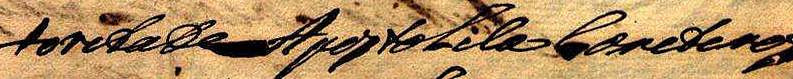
toritate ApostoLiCa CoMetera
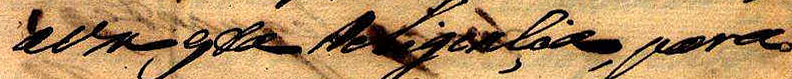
a vm esta DeLigenÇia, para
